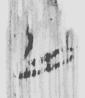㠯（以）
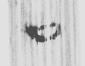厶
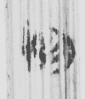利
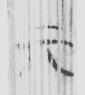亓
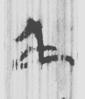身
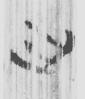出
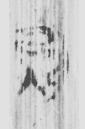則
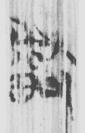{番攴}
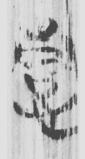情
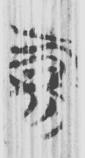{㫃昜}
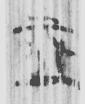亞
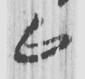㠯（以）
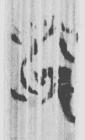流
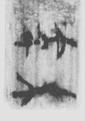{卅九}
